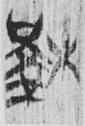梏
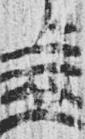者（諸）
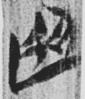廷
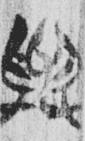與
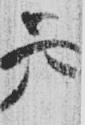亓（其）
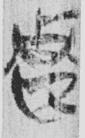妻
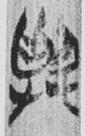與
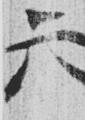亓（其）
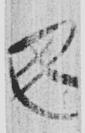母
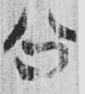公
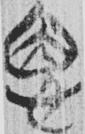恩（忍）
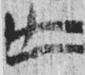亡（無）
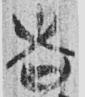告告
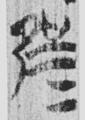強強
